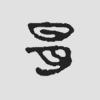日月
